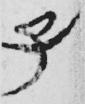子
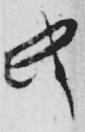女
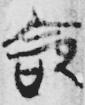命
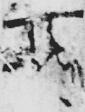亓（其）
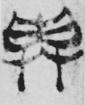與
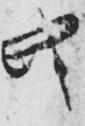女（若）
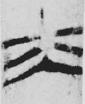夫
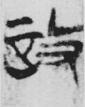政
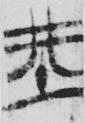坓（刑）
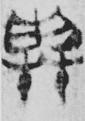與
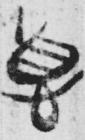惪（德）
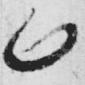㠯（以）
